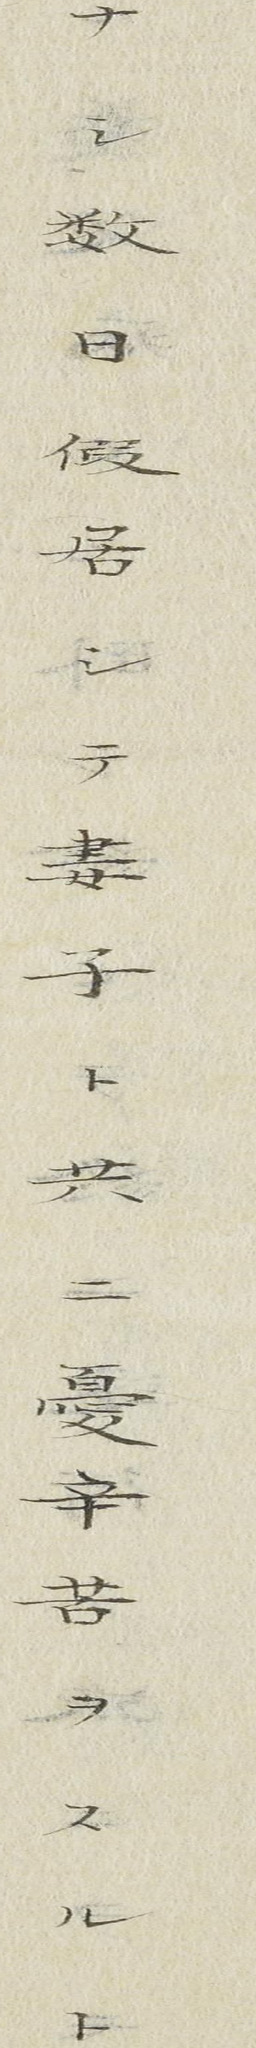ナシ数日仮居シテ妻子ト共ニ憂辛苦ヲスルト
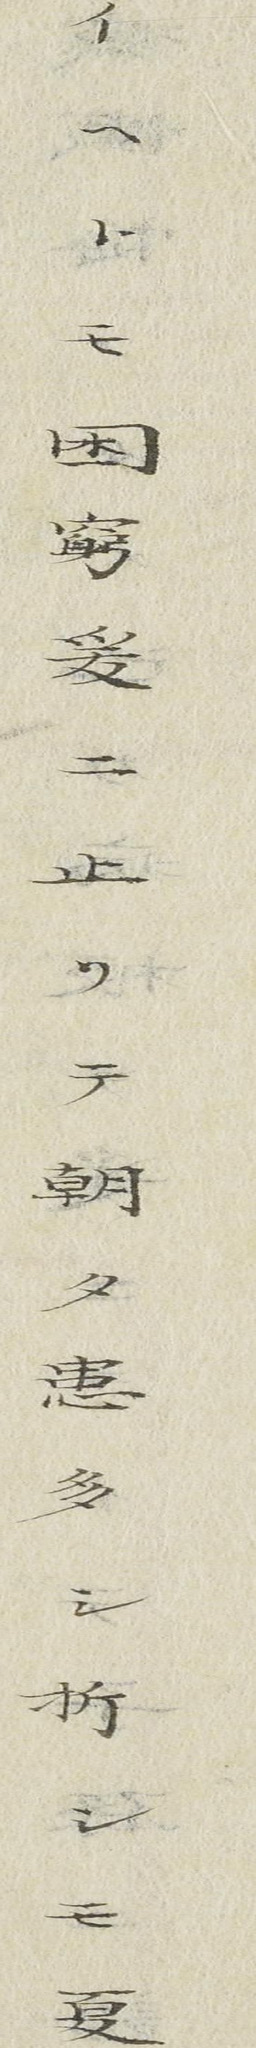イヘトモ困窮爰ニ止リテ朝夕患多シ折シモ夏
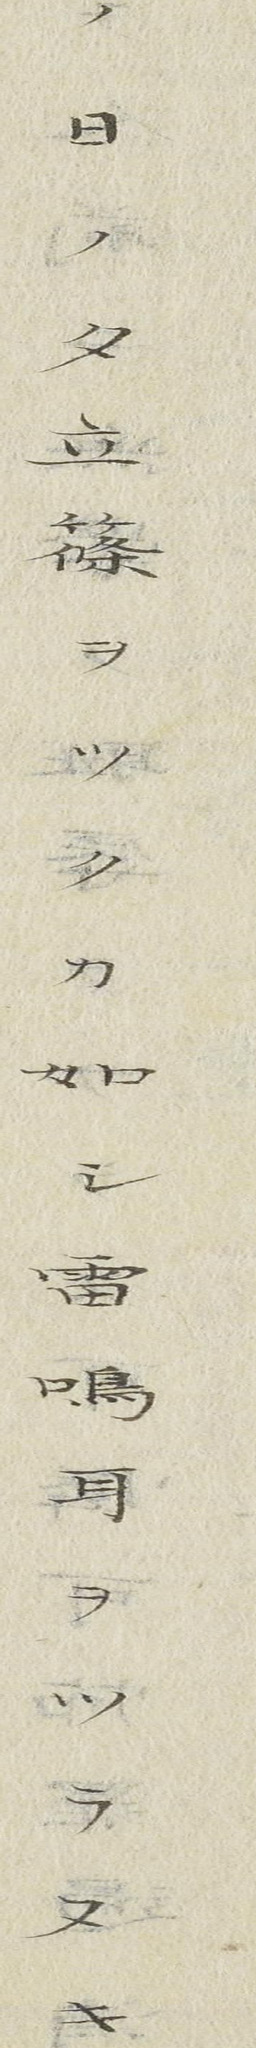ノ日ノ夕立篠ヲツクカ如シ雷鳴耳ヲツラヌキ
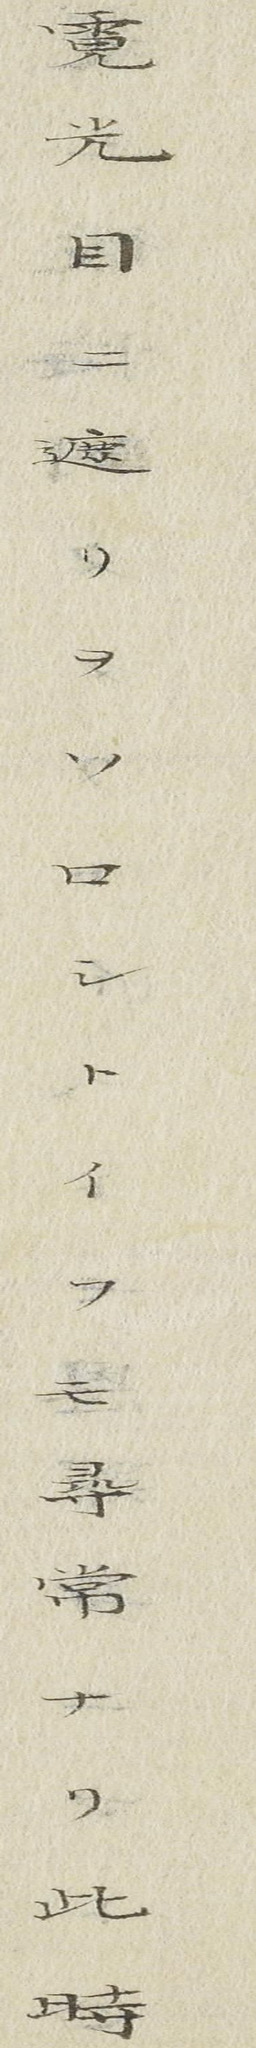電光目ニ遮リヲソロシトイフモ尋常ナリ此時
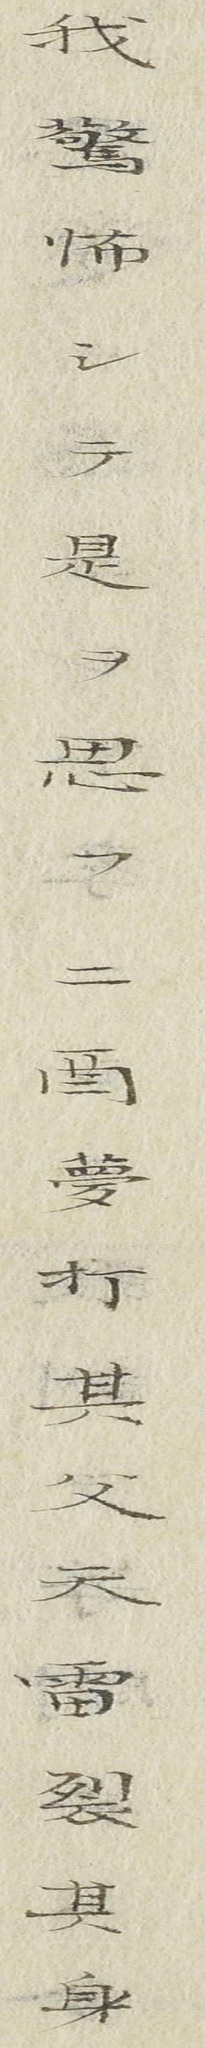我驚怖シテ是ヲ思フニ酉夢打其父天雷裂其身
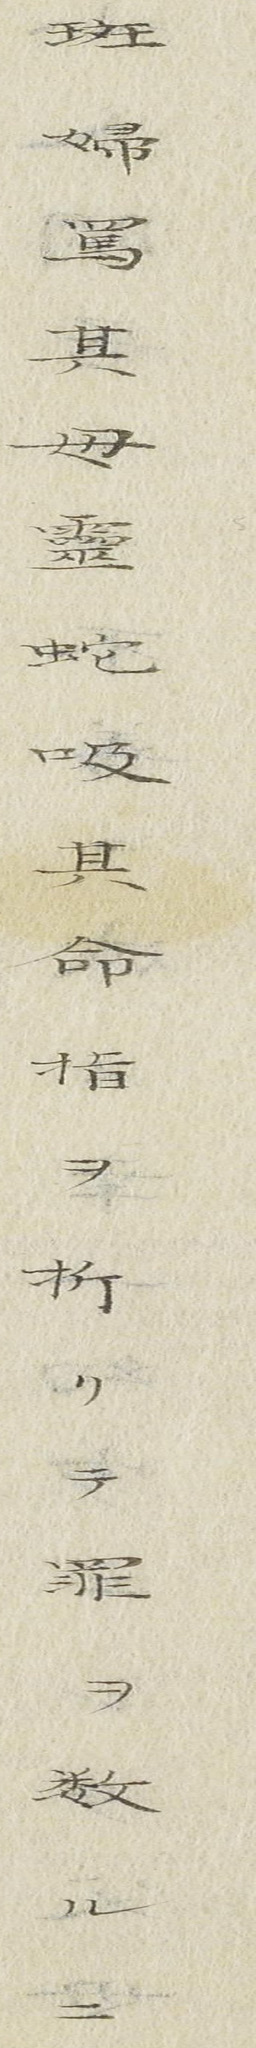斑婦罵其母霊蛇吸其命指ヲ折リテ罪ヲ数ルニ
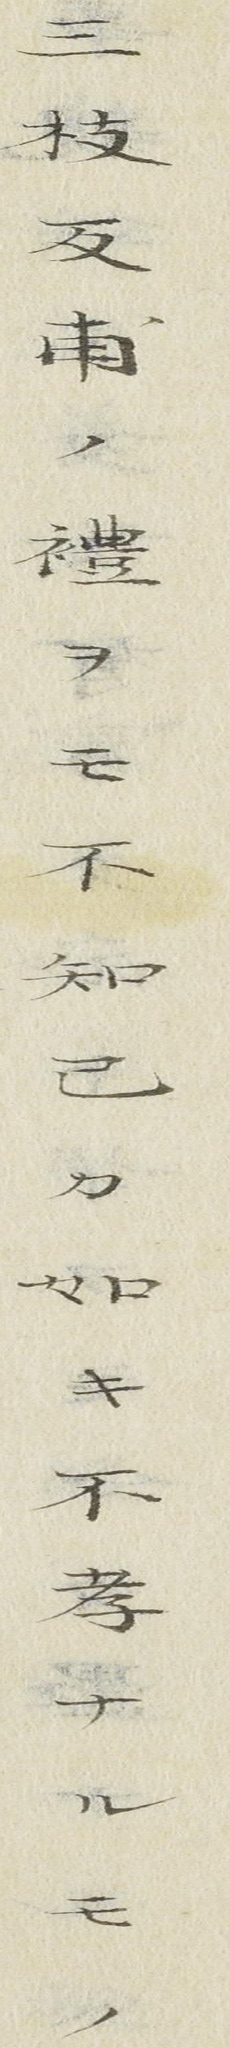三枝反甫ノ礼ヲモ不知己カ如キ不孝ナルモノ
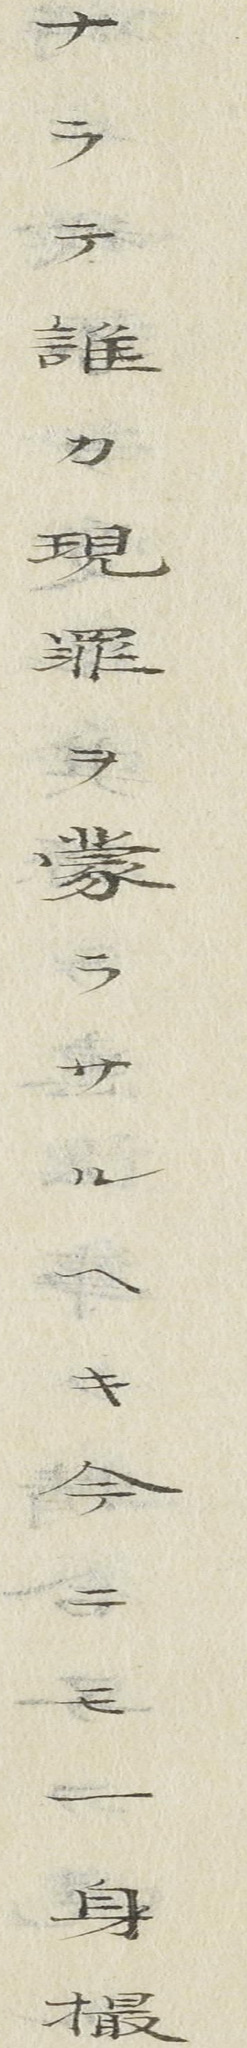ナラテ誰カ現罪ヲ蒙ラサルヘキ今ニモ一身撮
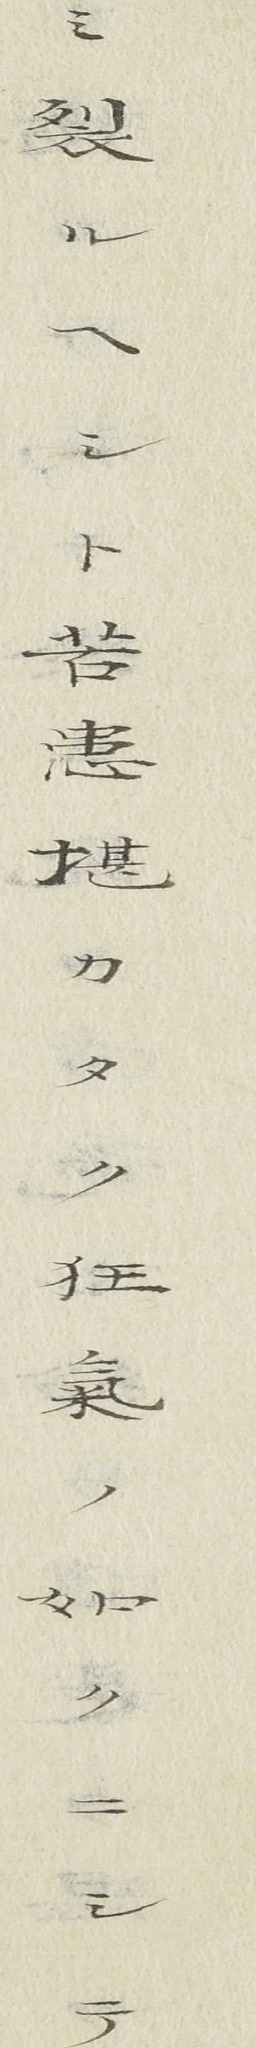ミ裂ルヘシト苦患堪カタク狂気ノ如クニシテ
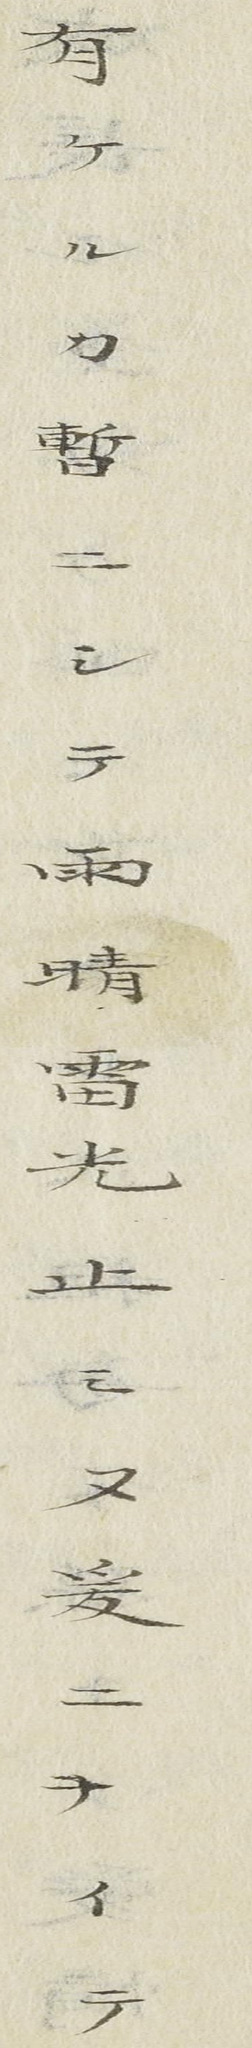有ケルカ暫ニシテ雨晴雷光止モヌ爰ニヲイテ
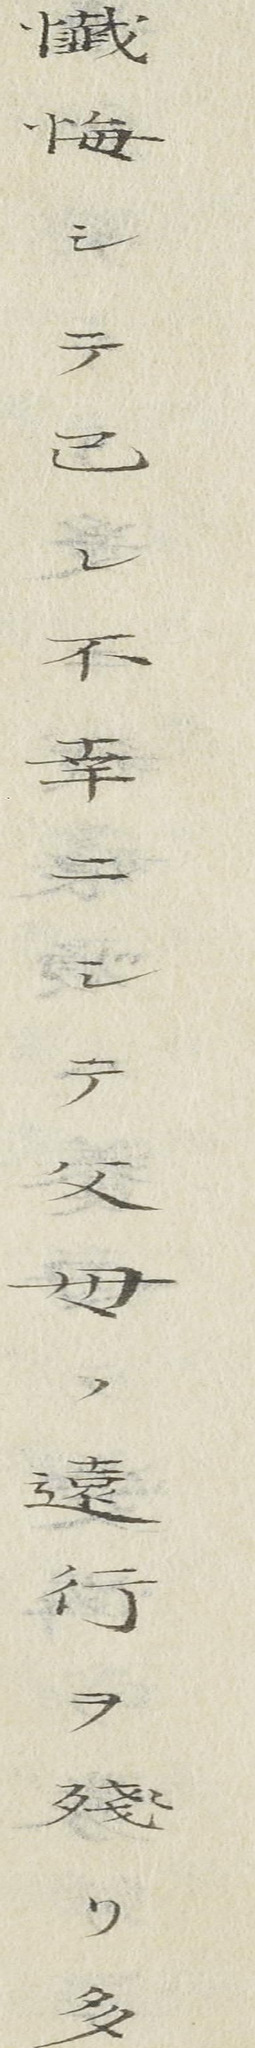懺悔シテ己レ不幸ニシテ父母ノ遠行ヲ残リ多
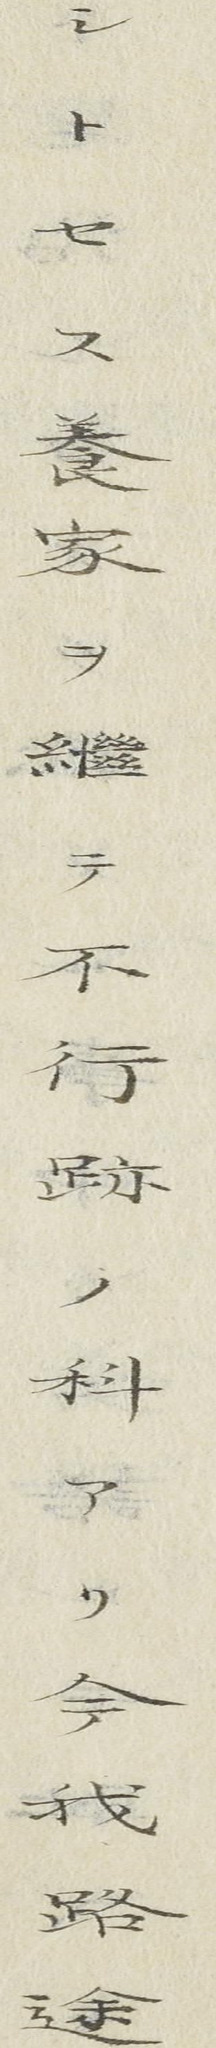シトセス養家ヲ継テ不行跡ノ科アリ今我路途
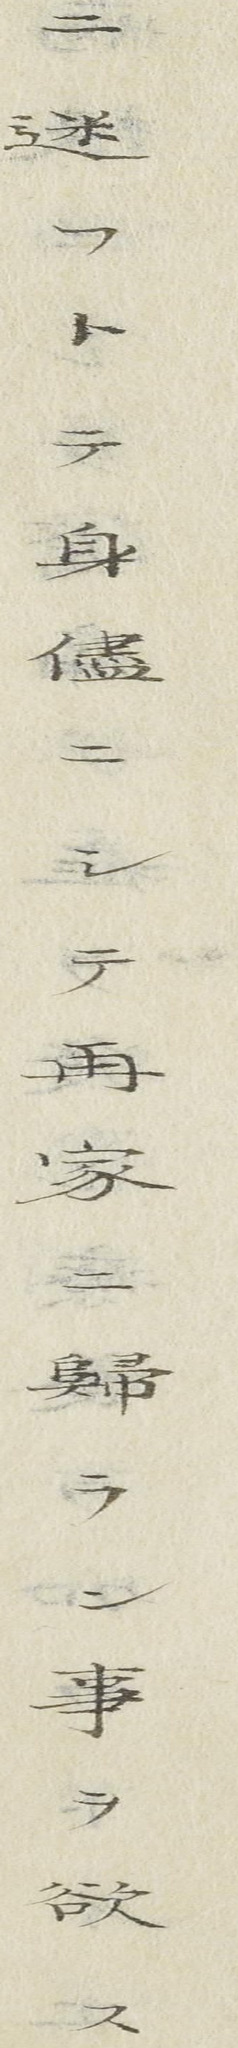ニ迷フトテ身儘ニシテ再家ニ帰ラン事ヲ欲ス
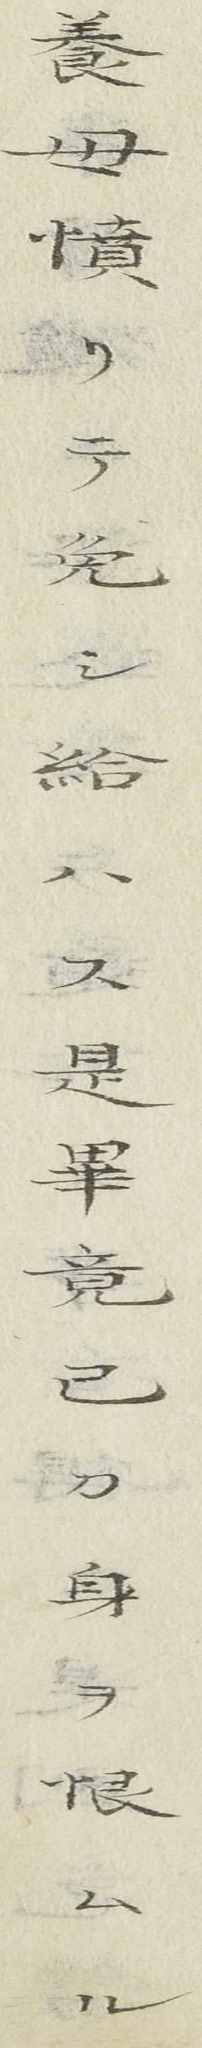養母憤リテ免シ給ハス是畢竟己カ身ヲ恨ムル
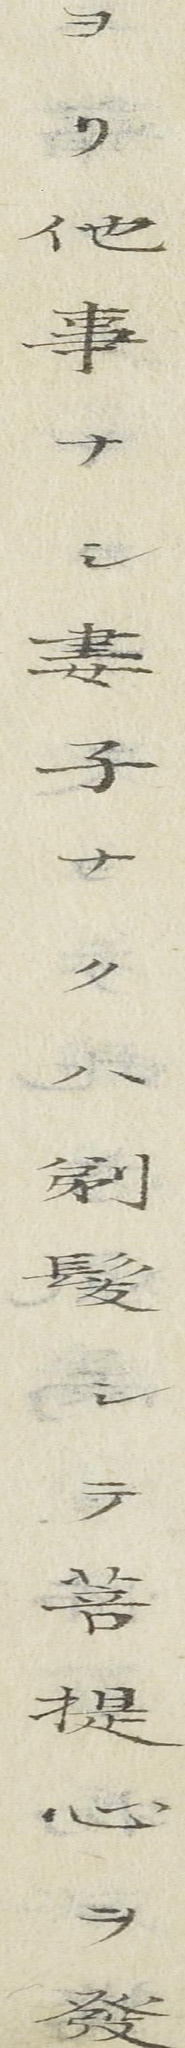ヨリ他事ナシ妻子ナクハ剃髪シテ菩提心ヲ発
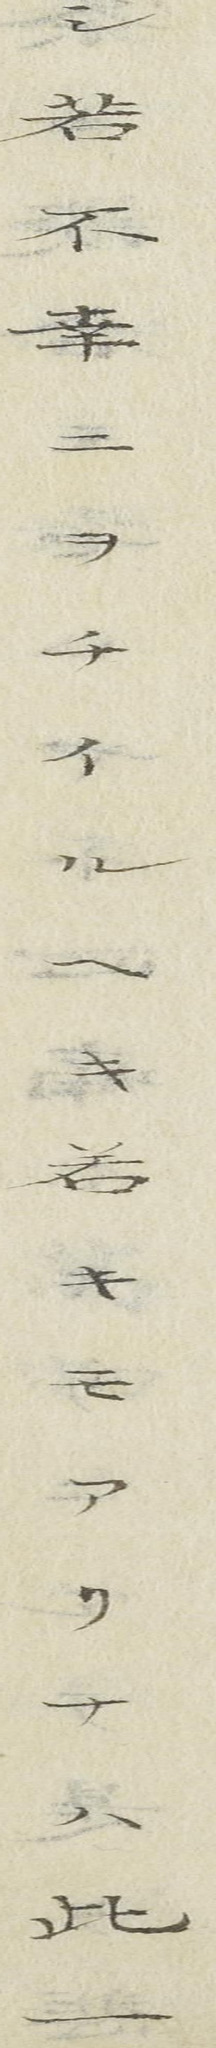シ若不幸ニヲチイルヘキ若キモアリナハ此一
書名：地災撮要　地震之部　巻ノ二
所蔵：東京大学地震研究所図書室 Earthquake Research Institute Library, The University of Tokyo, JAPAN
